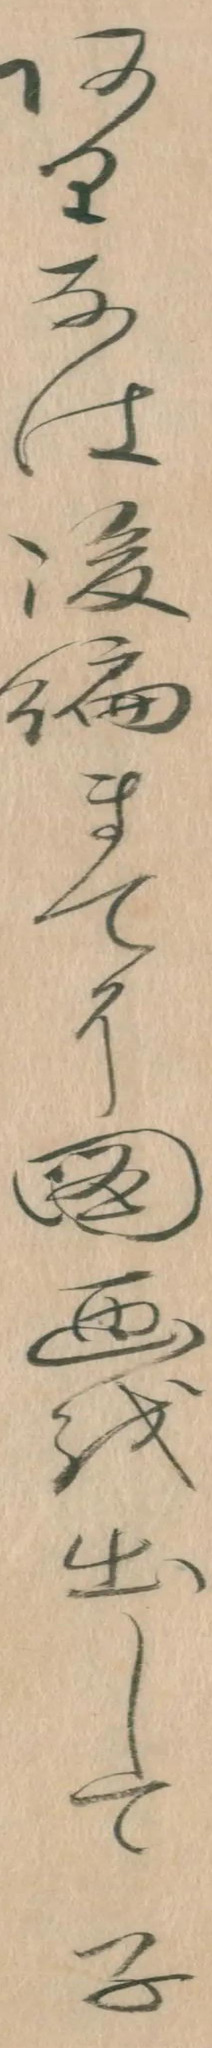ありなは後編まてに図画を出して子
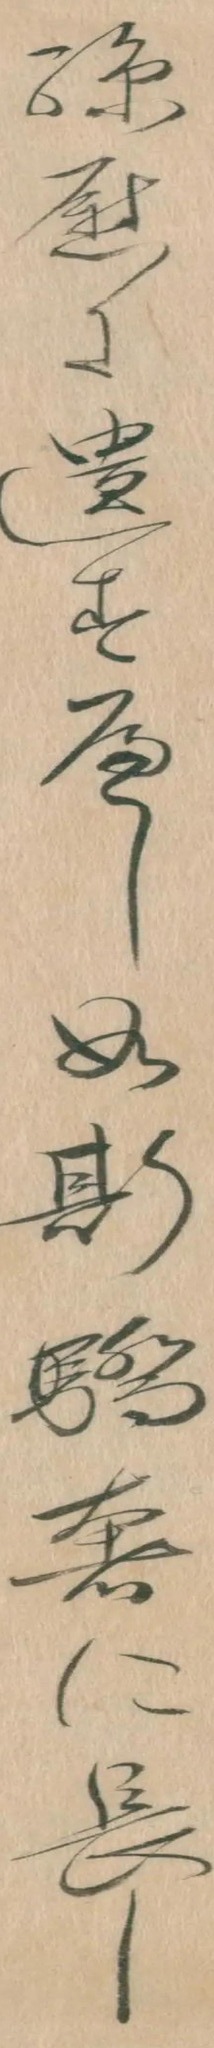孫慰に遺すへし如斯驕奢に長し
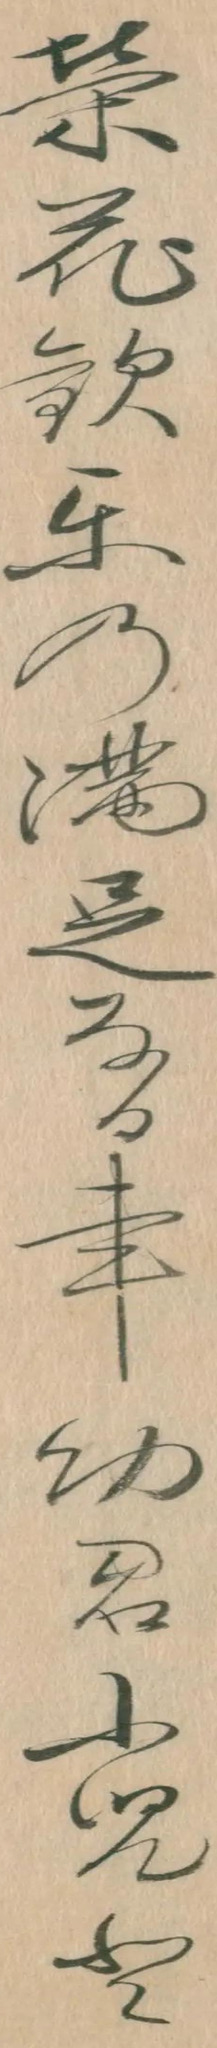榮花歓楽の満足なる事幼君小児と
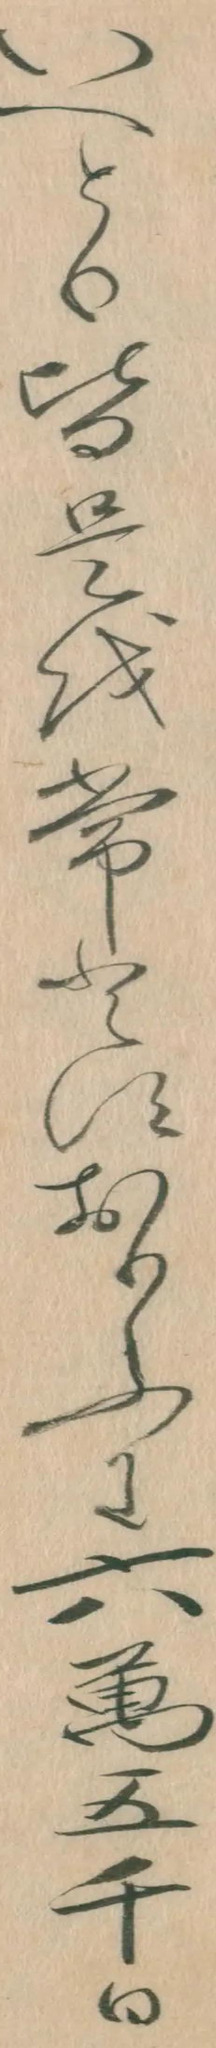いへとも皆是を常とすおもふに六萬五千日
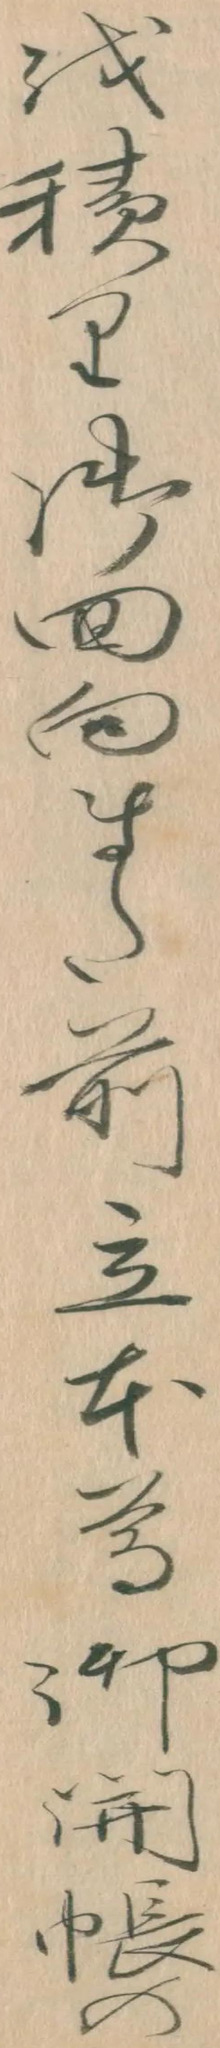を積り御回向また前立本尊御開帳の
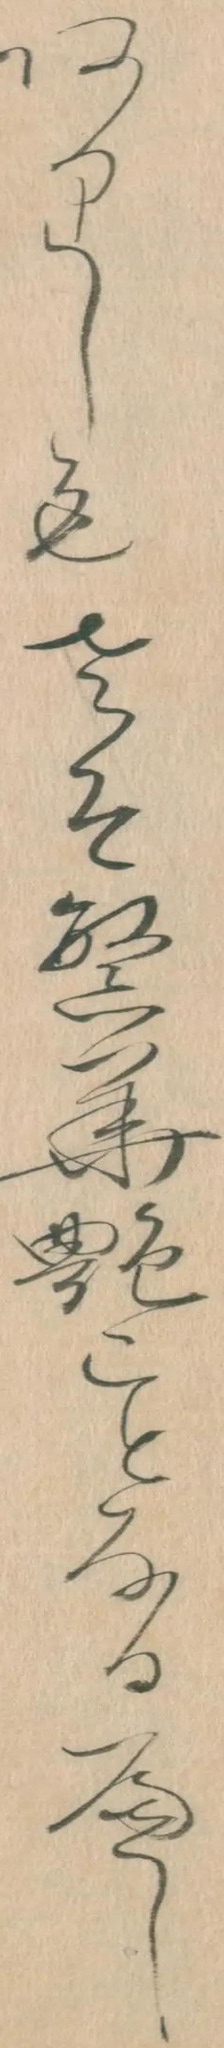ありしもさそ繁華艶ことなるへし
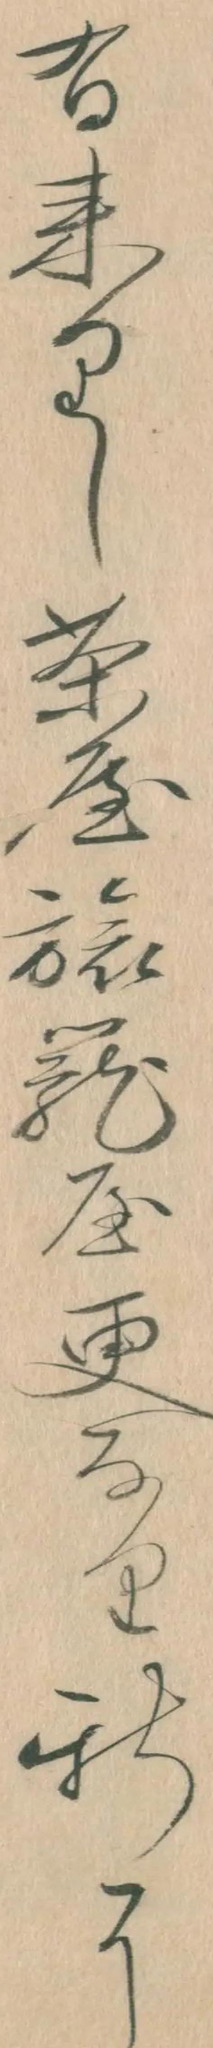有来りし茶屋旅籠屋更なり新に
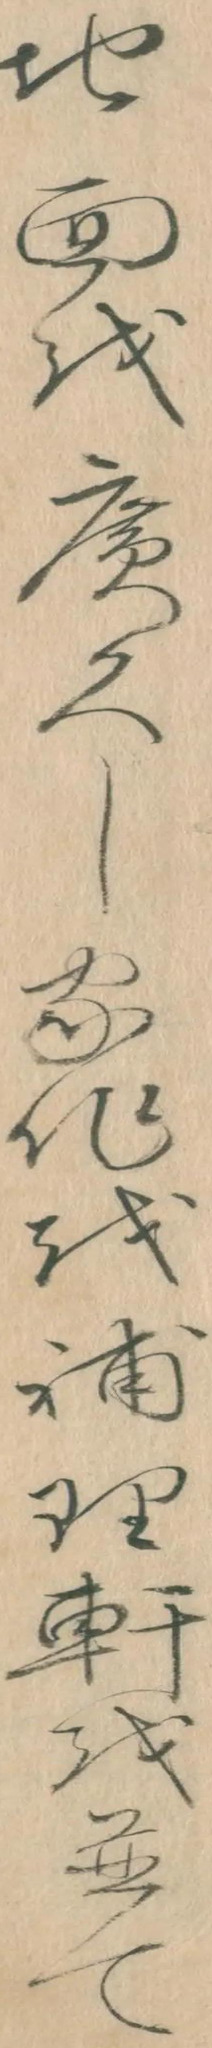地面を廣くし家作を補理軒を並て

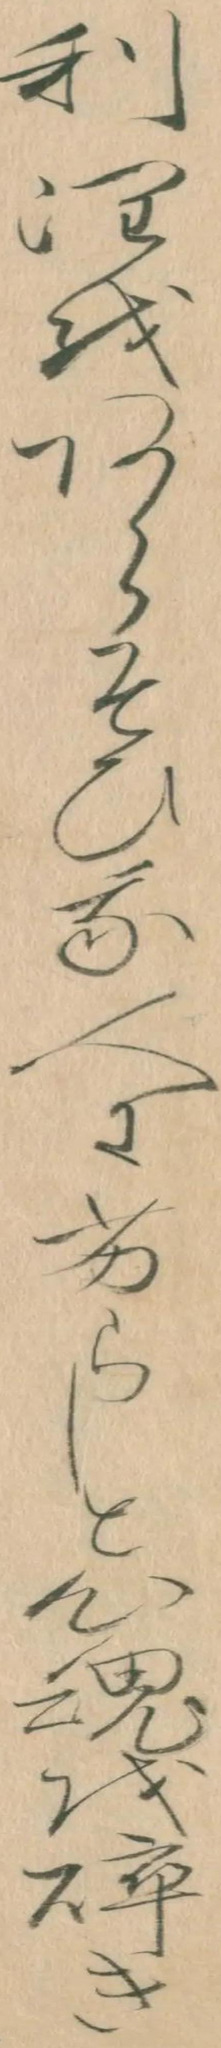利潤をあらそひ我人に劣らしと心魂を碎き
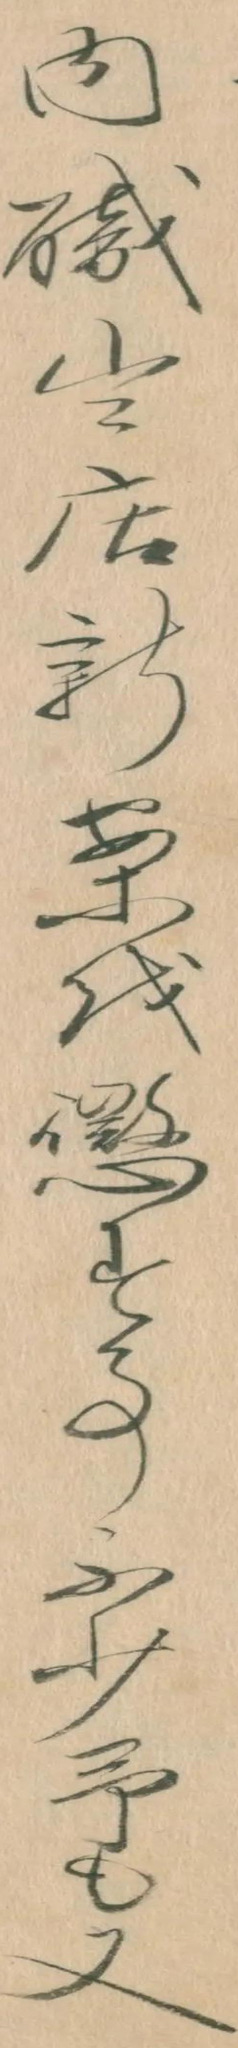内職出店新案を懲す事不少予も又
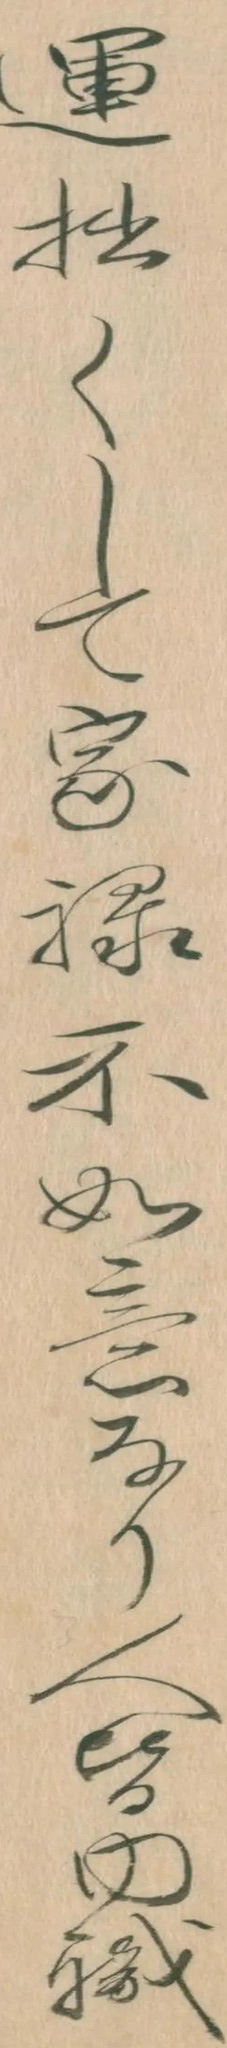運拙くして家禄不如意なり人皆内職
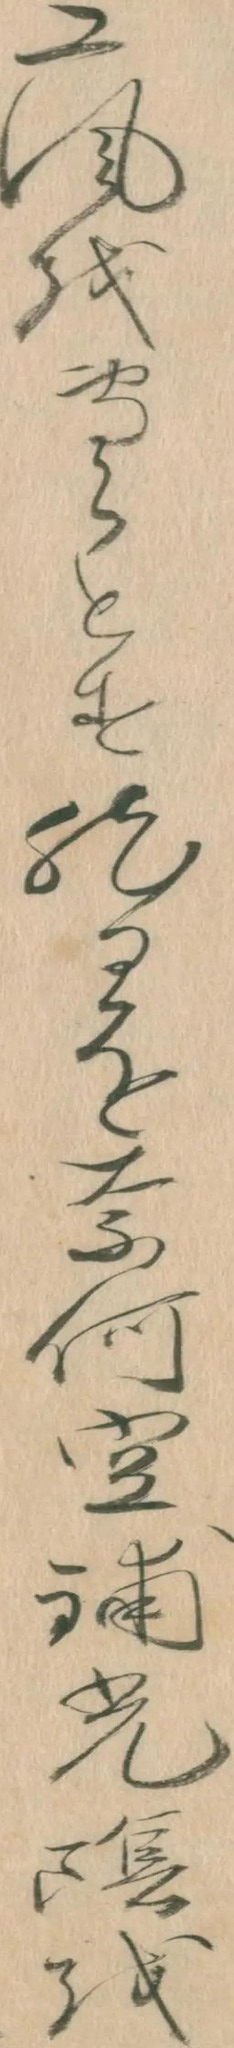工風を専らとす然るを奈何空鋪光陰を
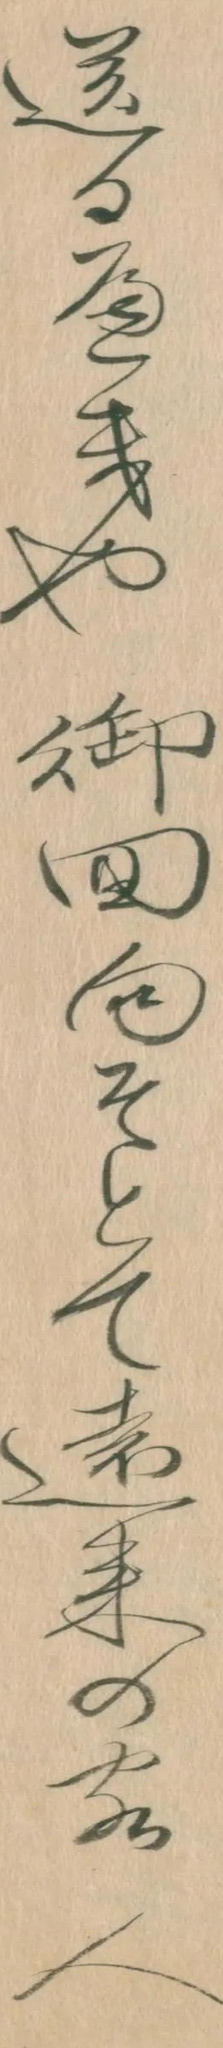送るへきや御回向そとて遠来の客人
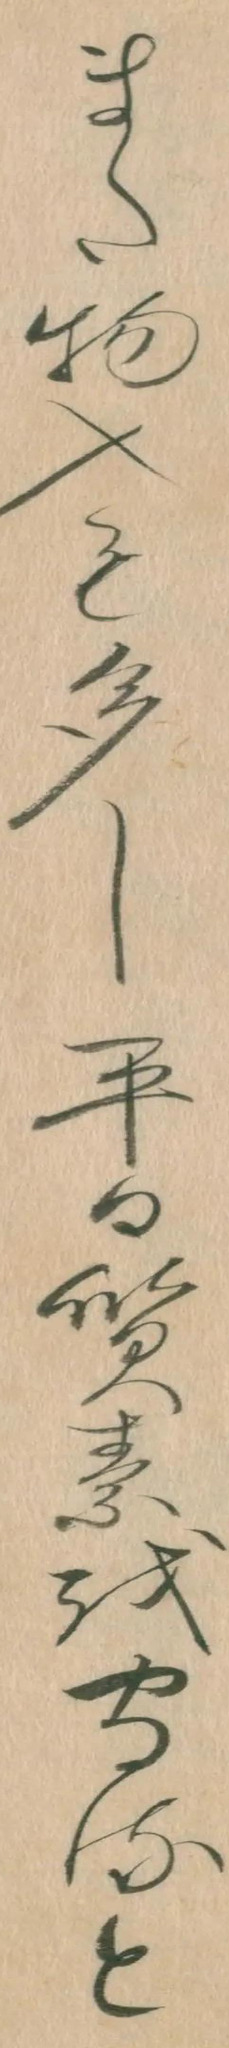また物入も多し平日質素を守ると
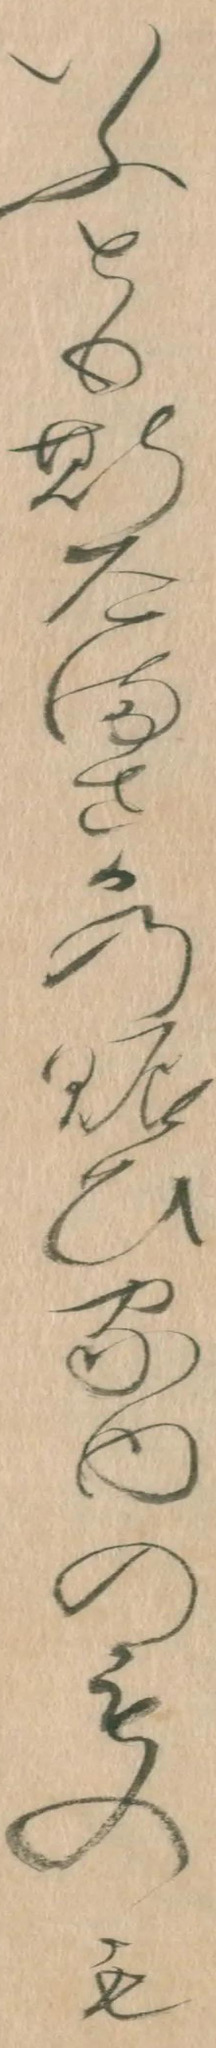いふとも斯たまさかの賑ひ家内のものも
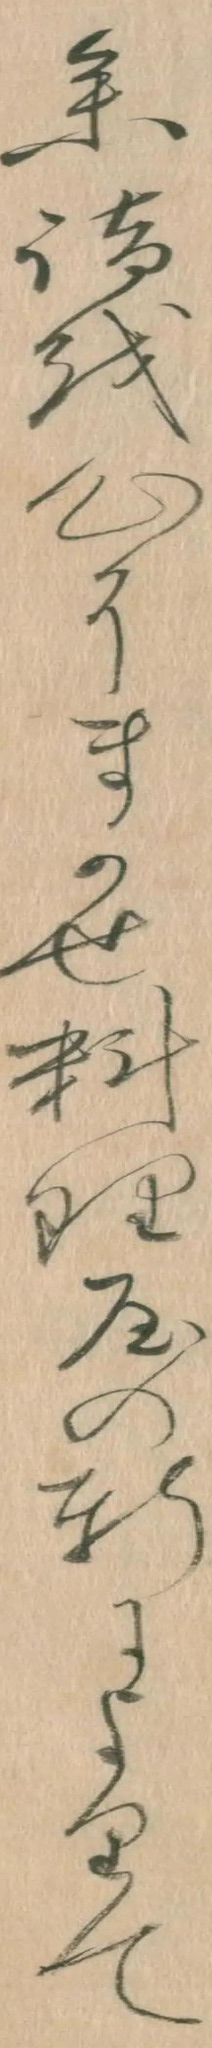参詣を心にまかせ料理屋の軒によりて
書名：俗語之種. [2]
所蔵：国立国会図書館 National Diet Library, JAPAN
